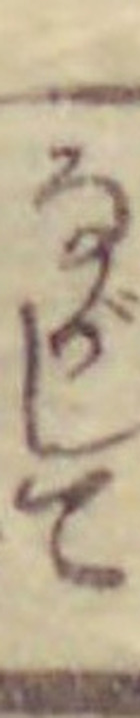ながして
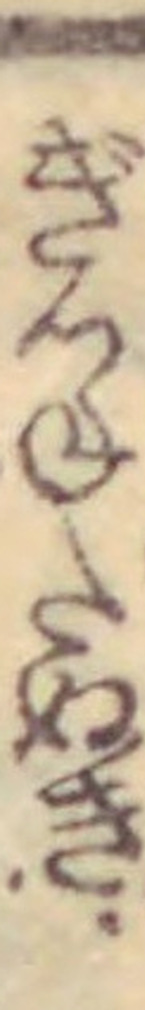ぎつねたぬき
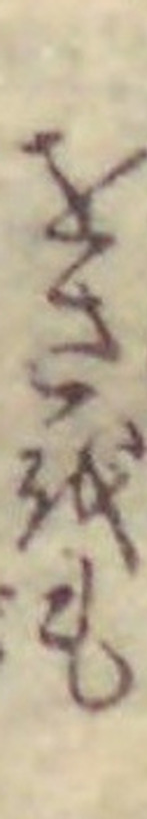をさをも
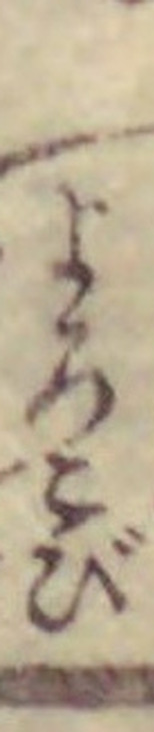よろこび
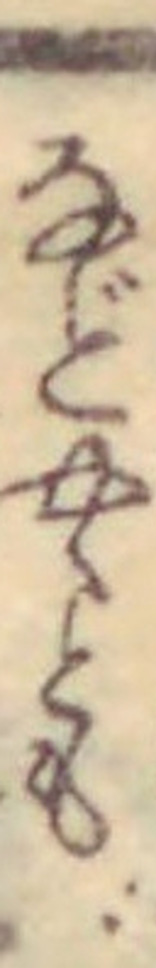などやゝとも
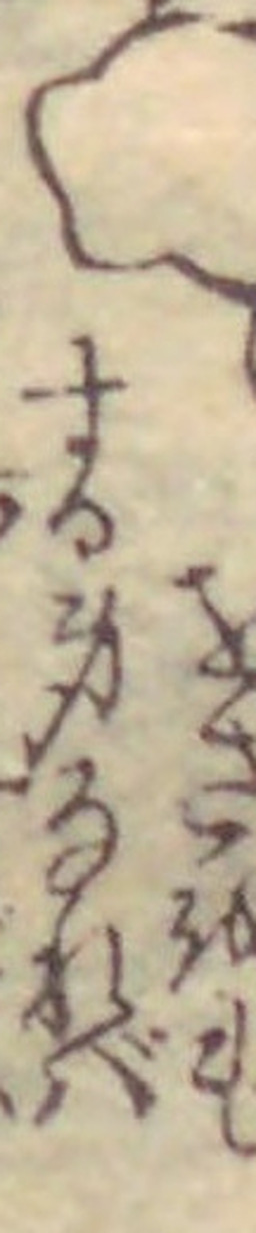する身なれば
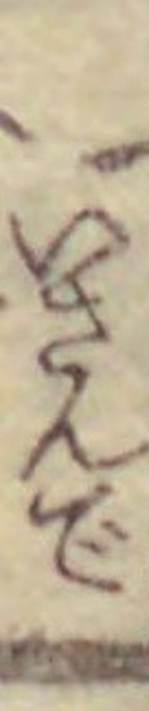いさんで
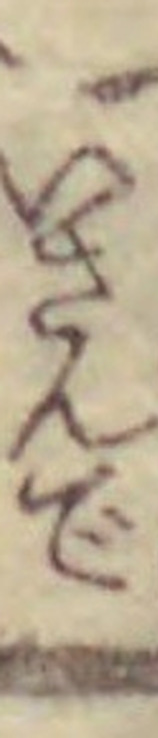いさんで
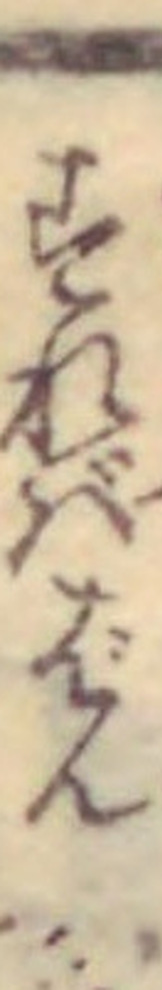すればばん
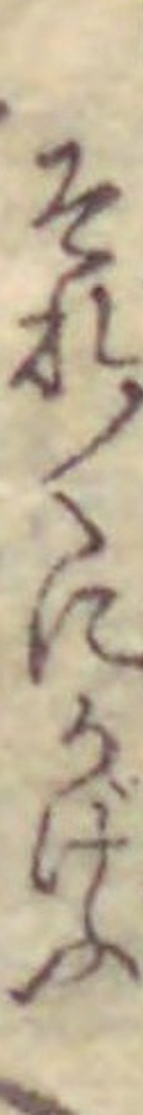それ〳〵にかげふ
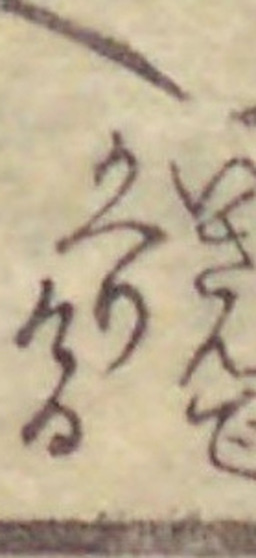かへりける
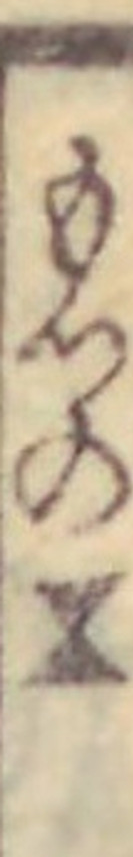もつの▼▲
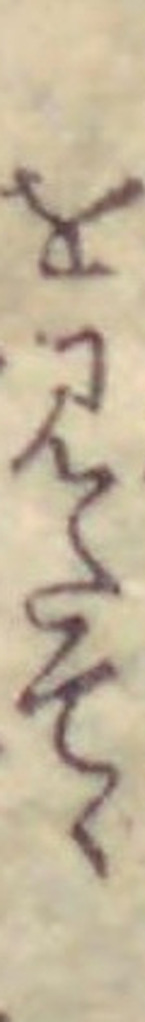を見たてゝ
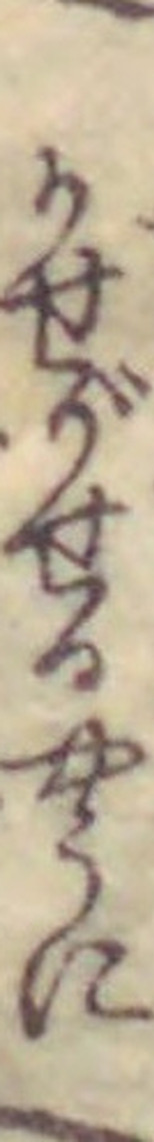かせがせるやうに
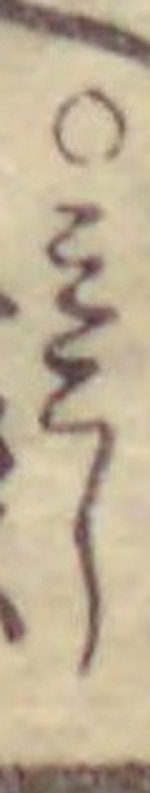○みこし
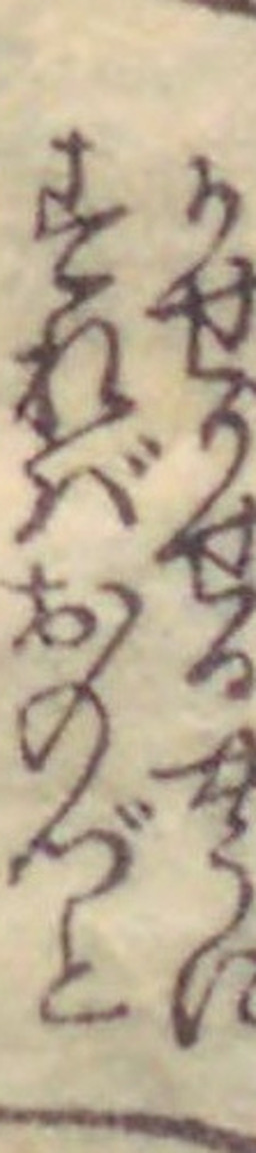すればおのづと
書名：化物世帯氣質
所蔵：国立国会図書館 National Diet Library, JAPAN
